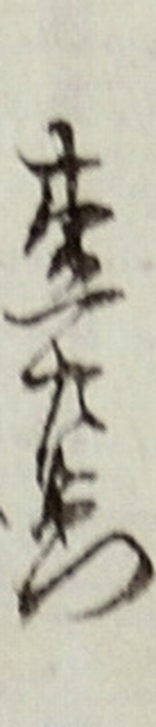杢左衛門
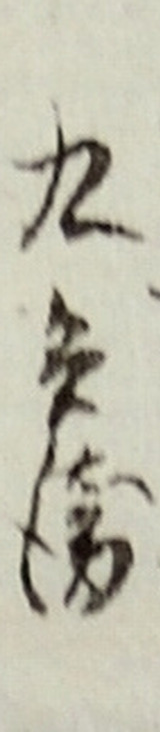九兵衛
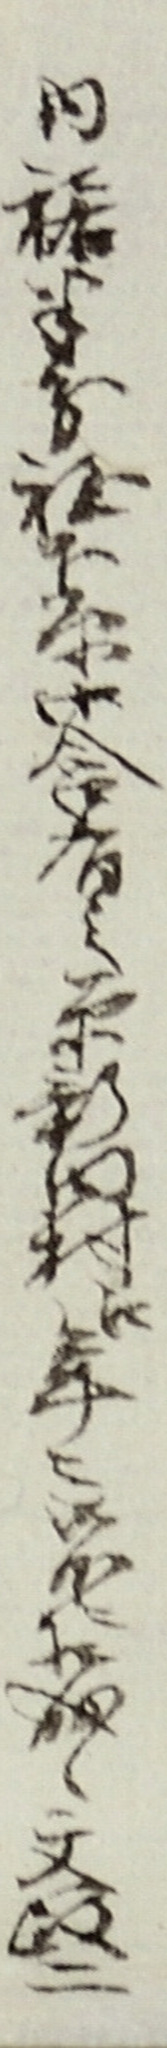内裾半分程下草御含有之原新田村え年々御加ニ相成候文政二
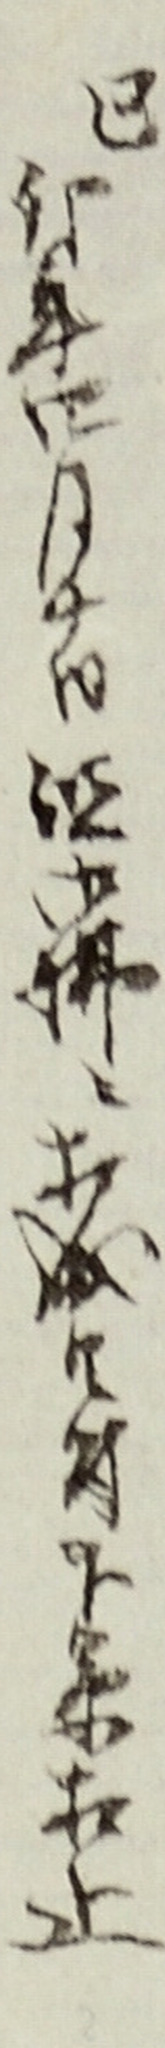己卯年四月十日組御払と相成候付下草相止
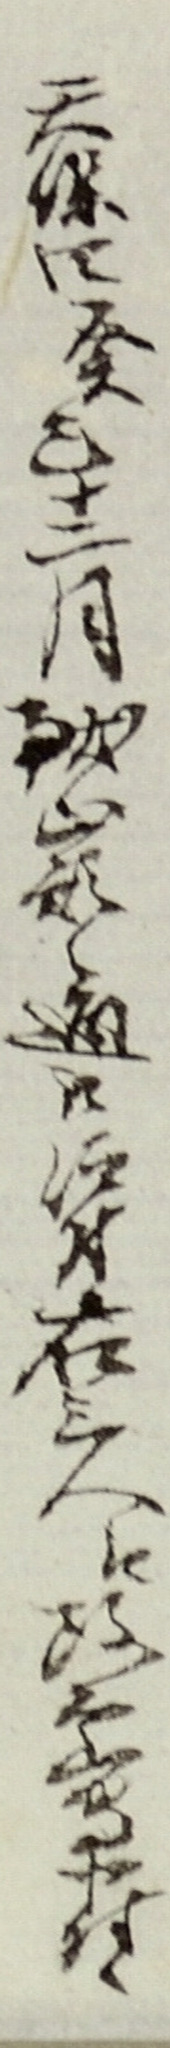天保四癸巳十二月献山願之通被仰付右三人え改而山守申付候
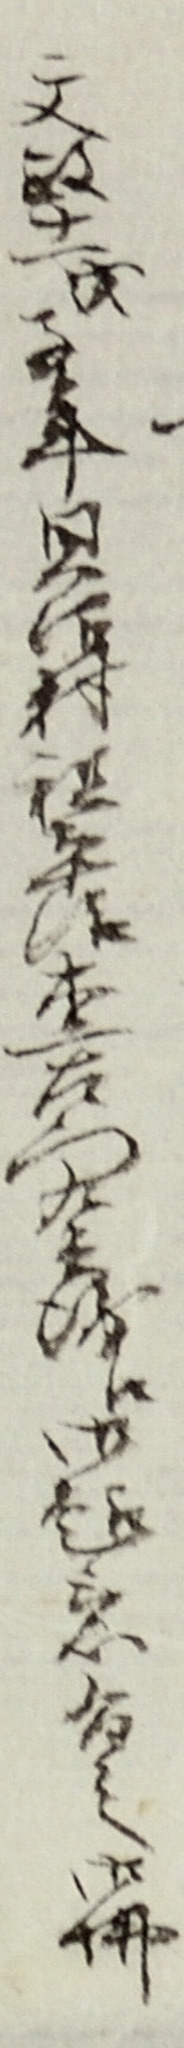文政十一戊子年貝沼村祖平治杢左衛門九兵衛え御趣意有之御払
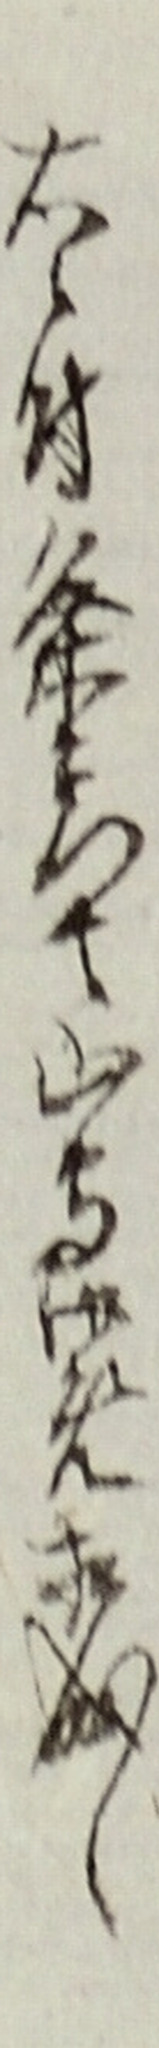右ニ付粂左衛門は山守御免相成候

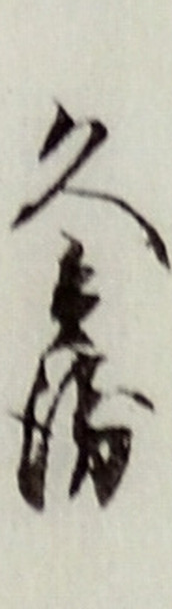長兵衛
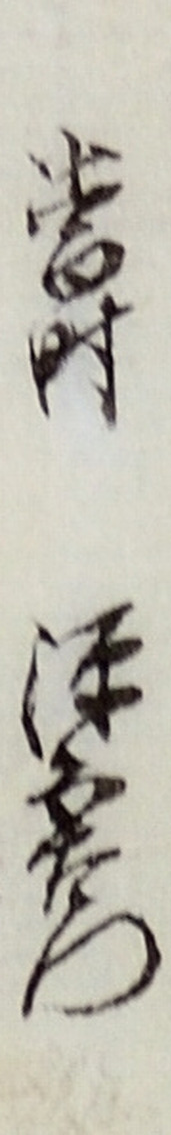当時源五右衛門
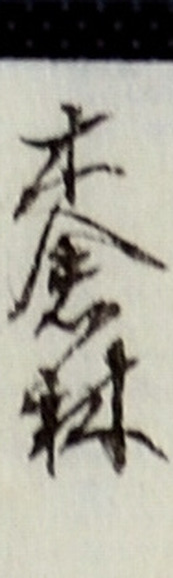木倉林
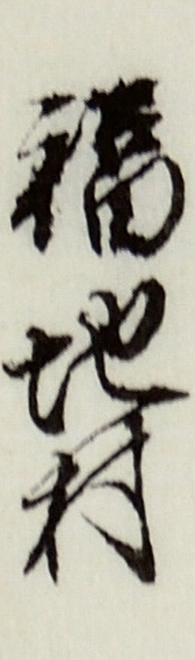福地村
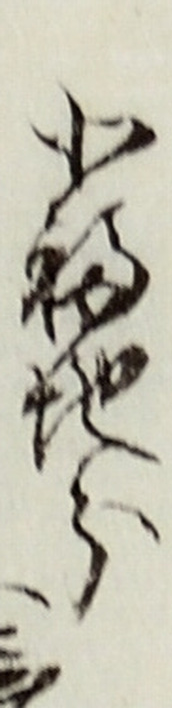北福地分
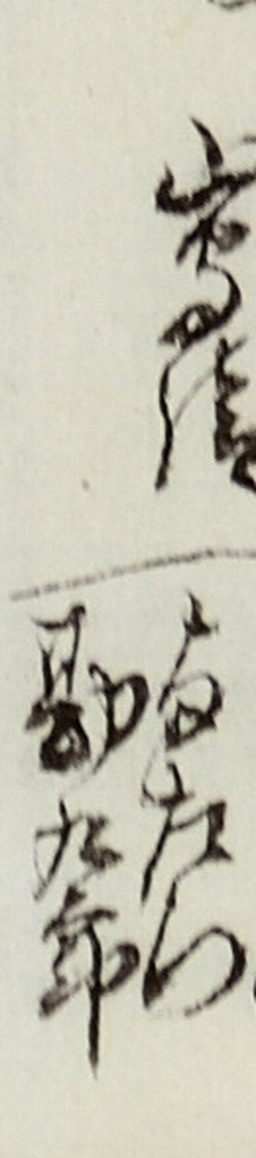勘九郎
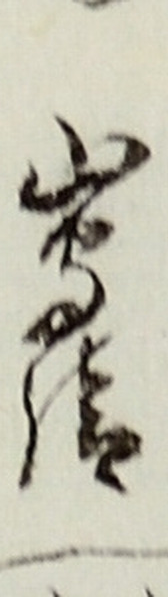山守請
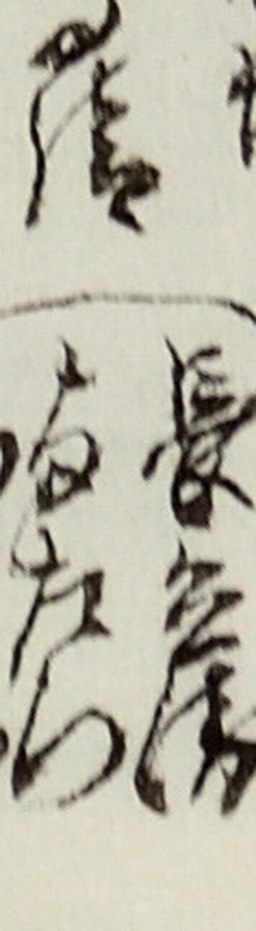与左衛門
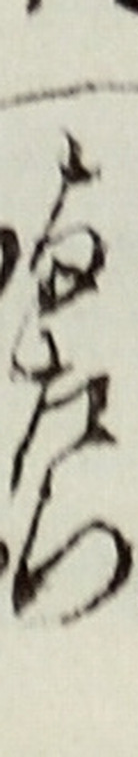与左衛門
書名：山林帳草稿
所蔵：伊那市立高遠町図書館・合同会社AMANE
